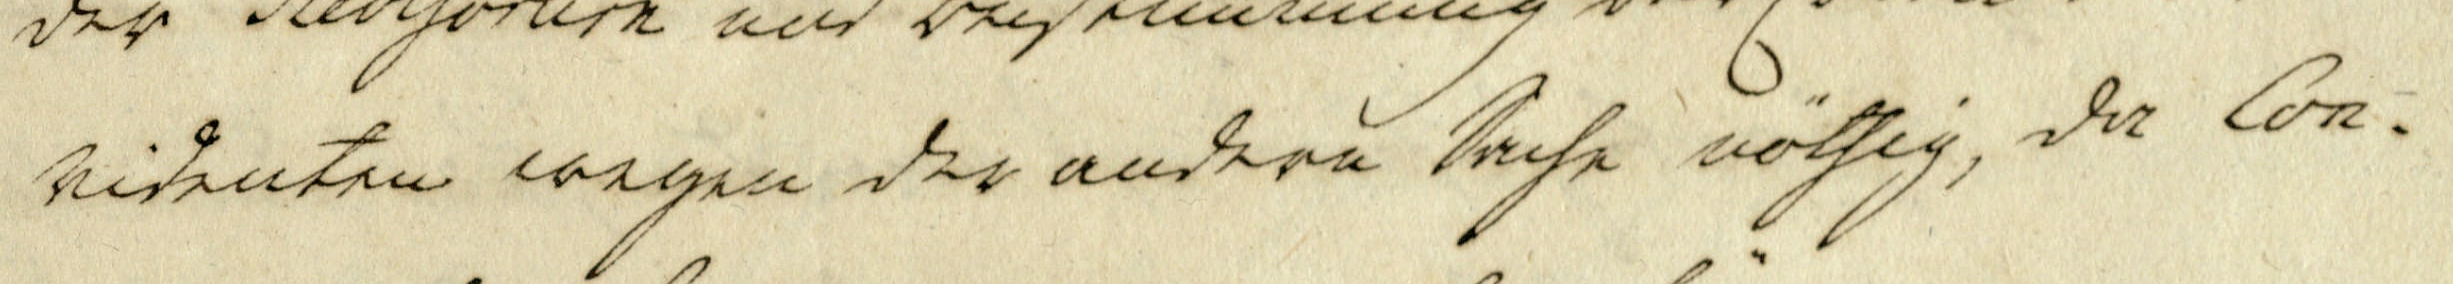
videnten wegen der andern Sache nöthig, da Con¬
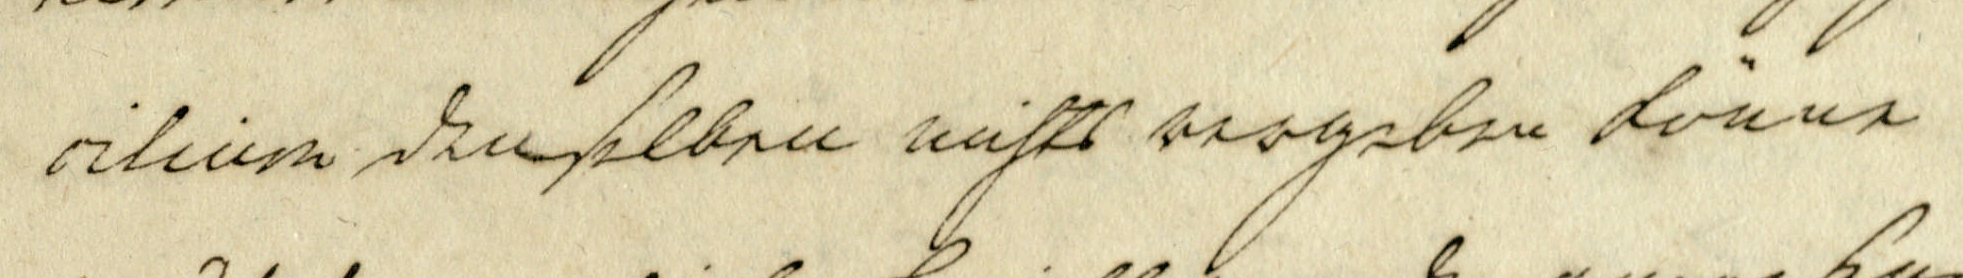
cilium denselben nichts vergeben könne.
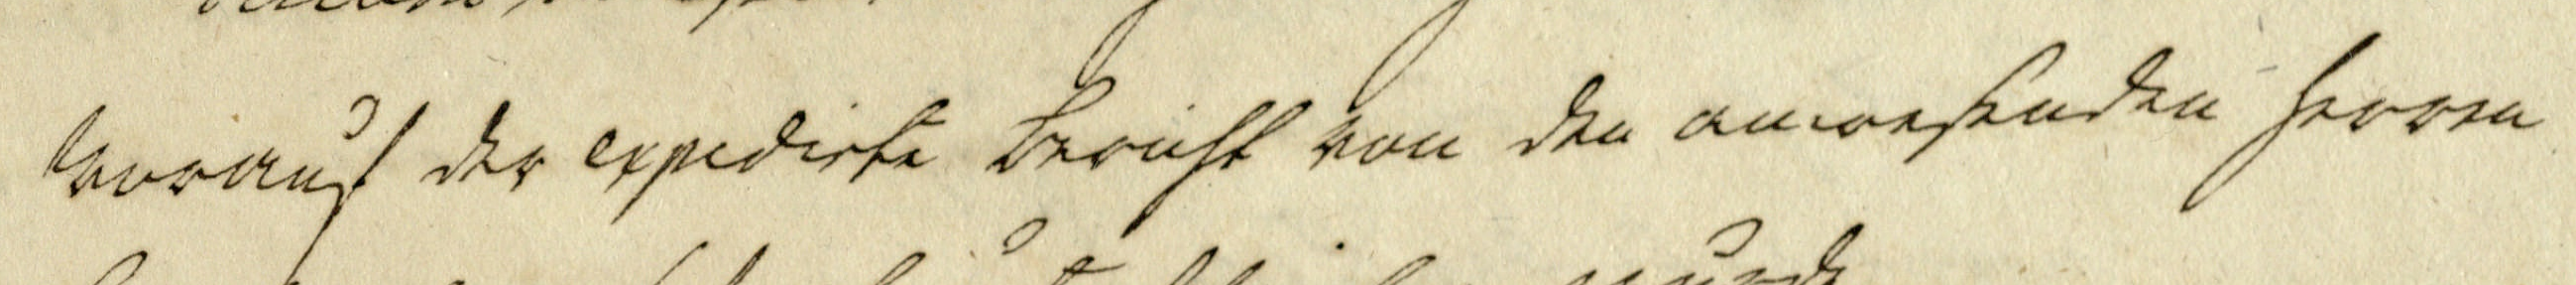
Worauf der expedirte von den anwesenden Herren
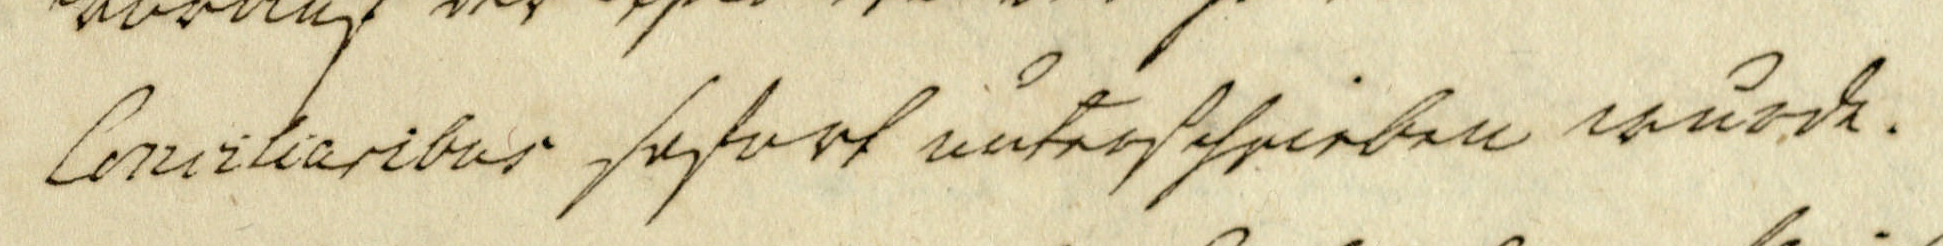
Conciliaribus sofort unterschrieben wurde.
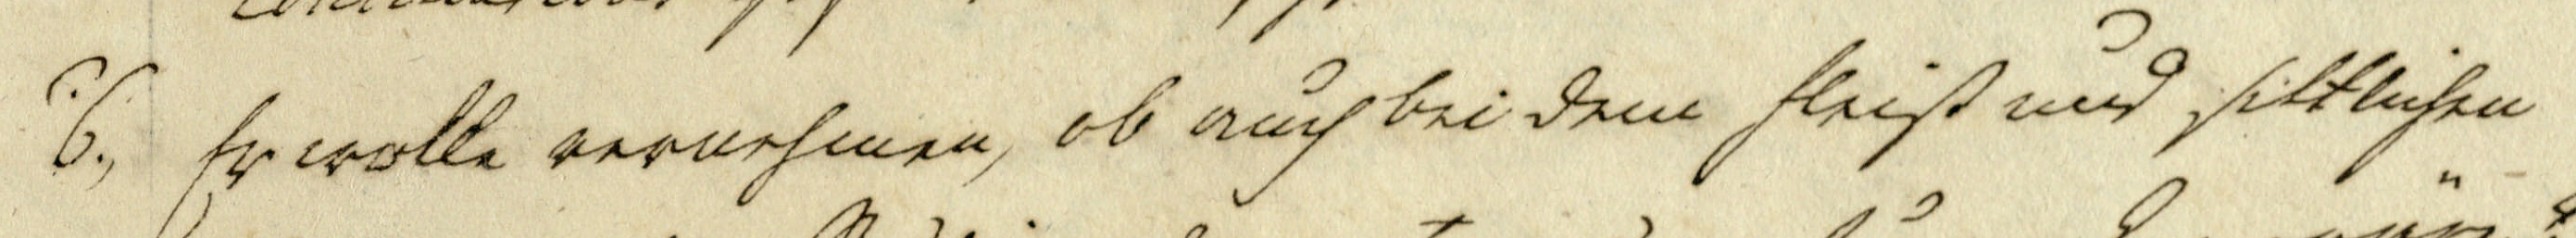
6., Er wolle vernehmen, ob auch bei dem Fleiß und sittlichen
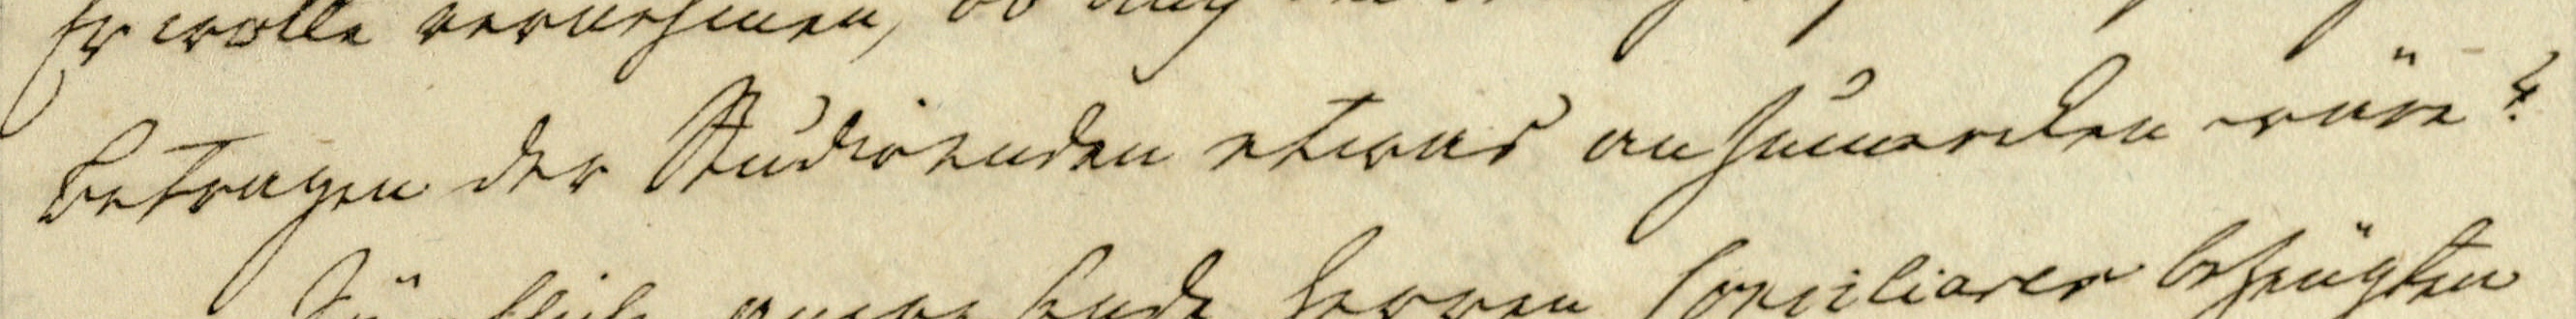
Betragen der Studierenden etwas anzumercken wäre?
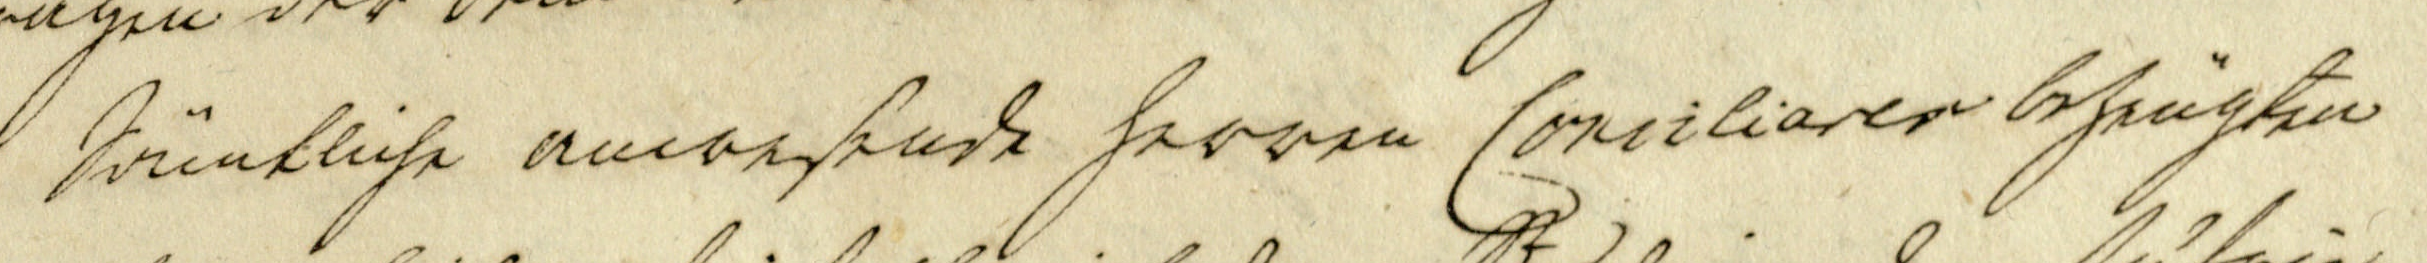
Sämtliche anwesende herren Conciliares bezeugten
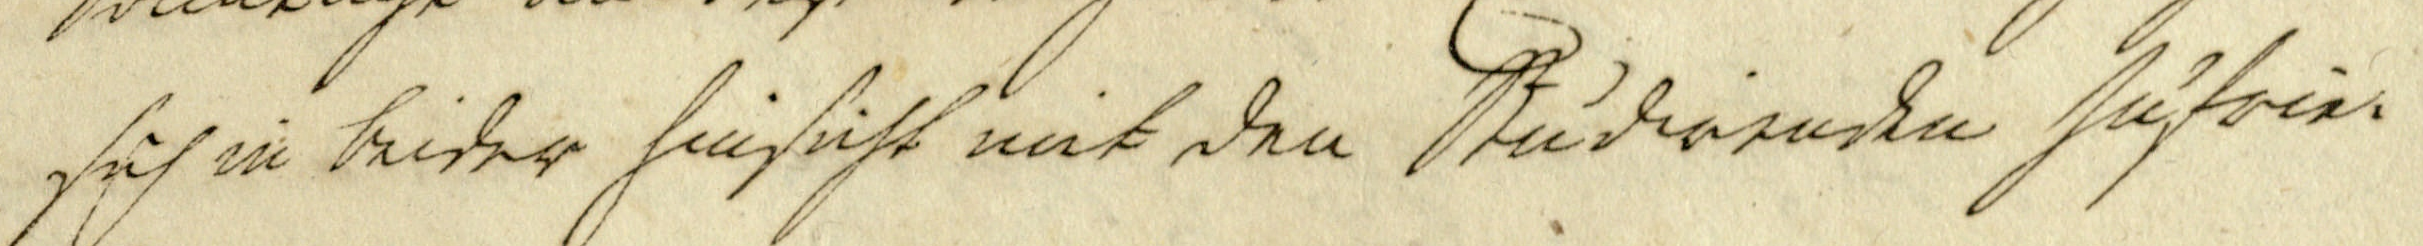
sich in beider Hinsicht mit den Studierenden zufrie¬
